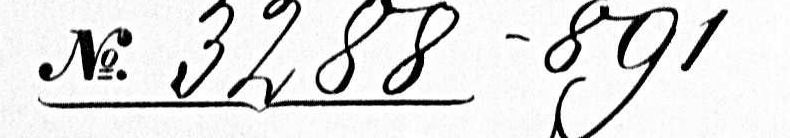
No. 3288 - 1891
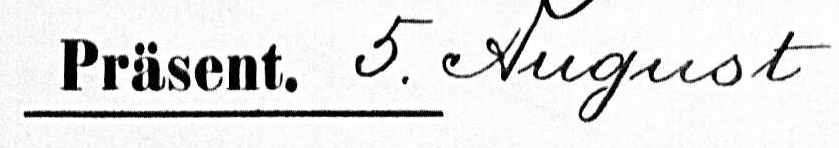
Präsent. 5. August
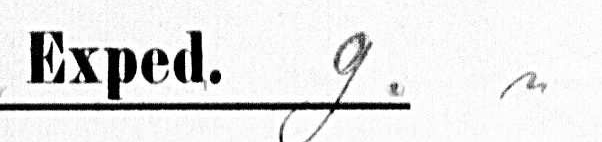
Exped. 9. „
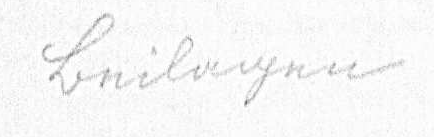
Beilagen
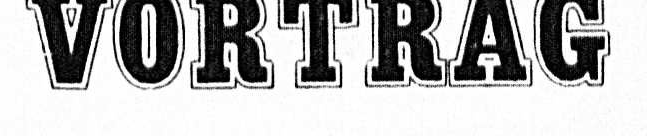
VORTRAG
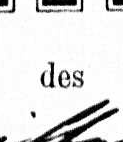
des
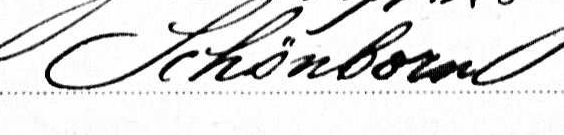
Schönborn
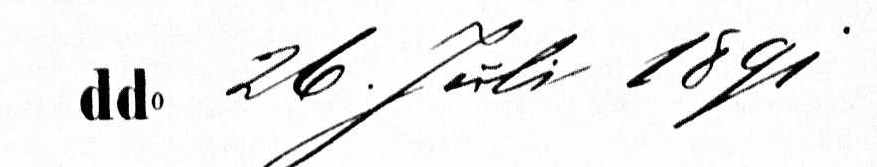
ddo 26. Juli 1891
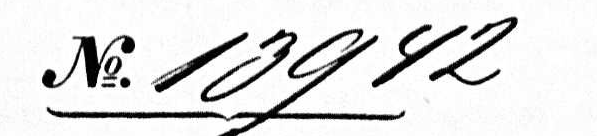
No. 13942
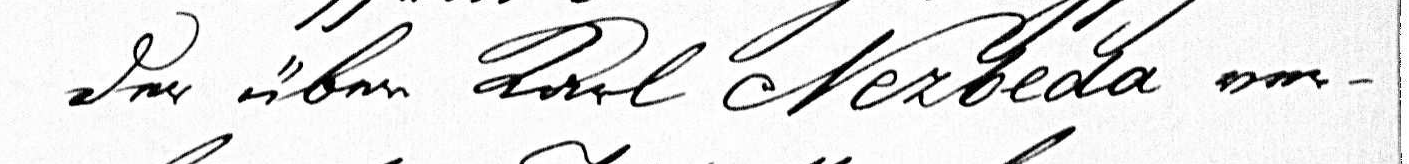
der über Karl Nezbeda ver¬
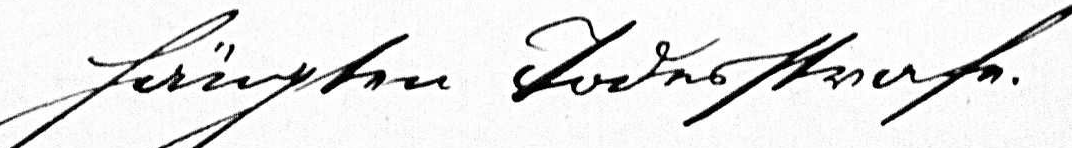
hängten Todesstrafe.
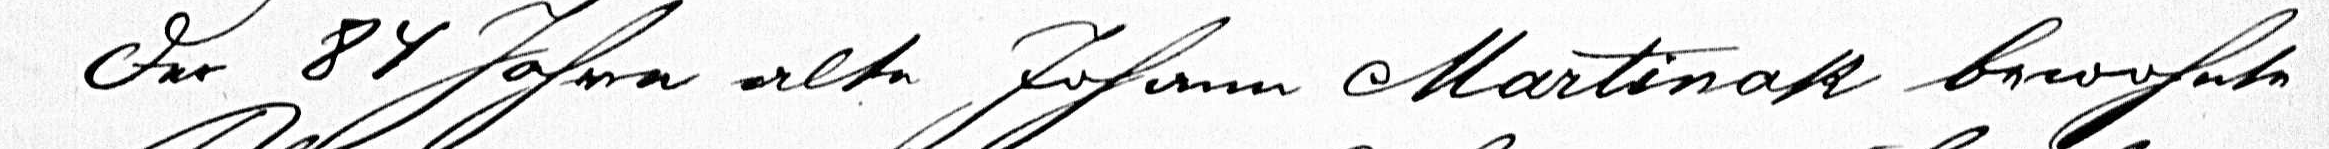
Der 84 Jahre alte Johann Martinak bewohnte
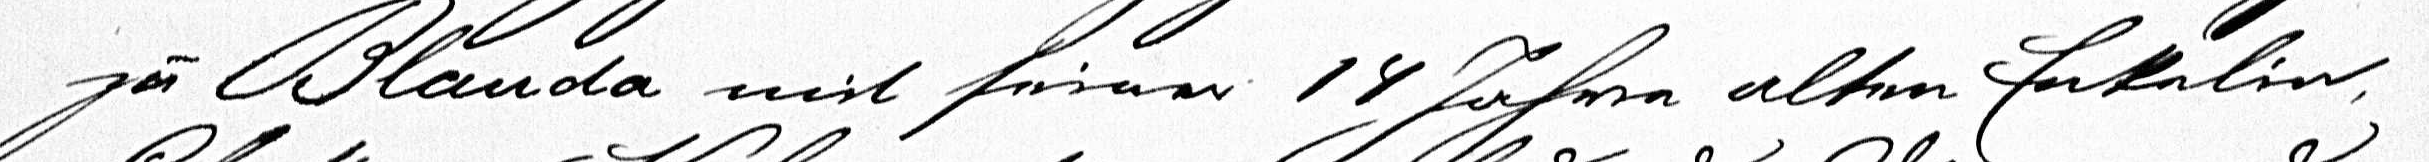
zu Blauda mit seiner 14 Jahre alten Enkelin,
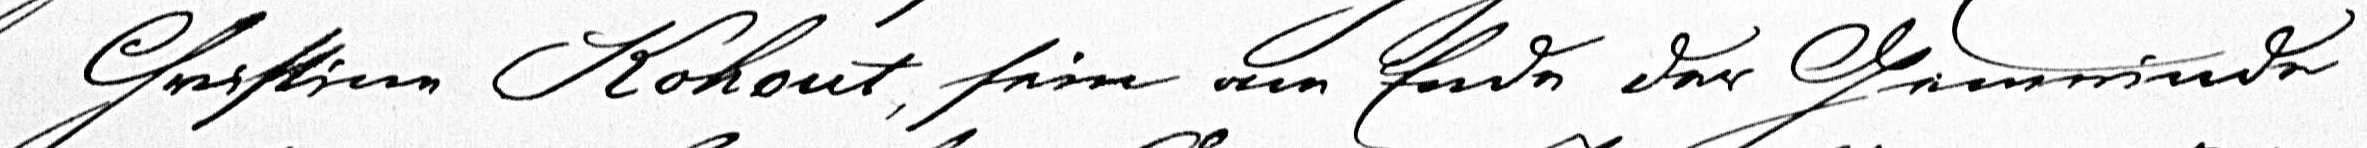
Christine Kohout, sein am Ende der Gemeinde
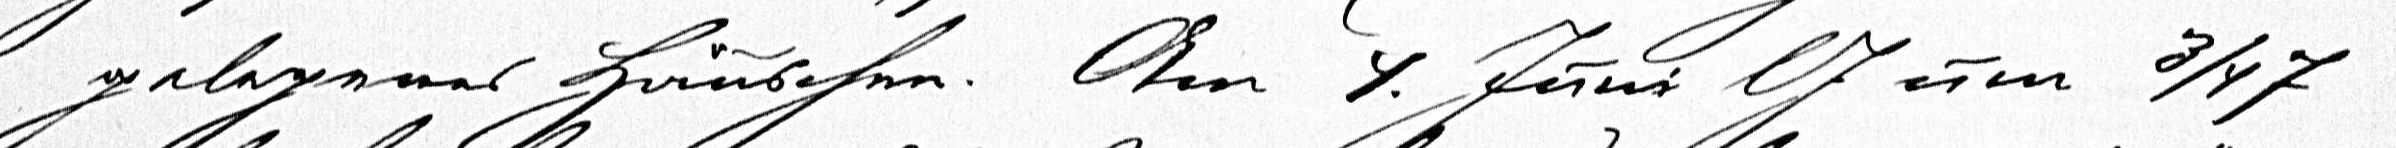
gelegenes Häuschen. Am 4. Juni l. J. um ¾ 7
